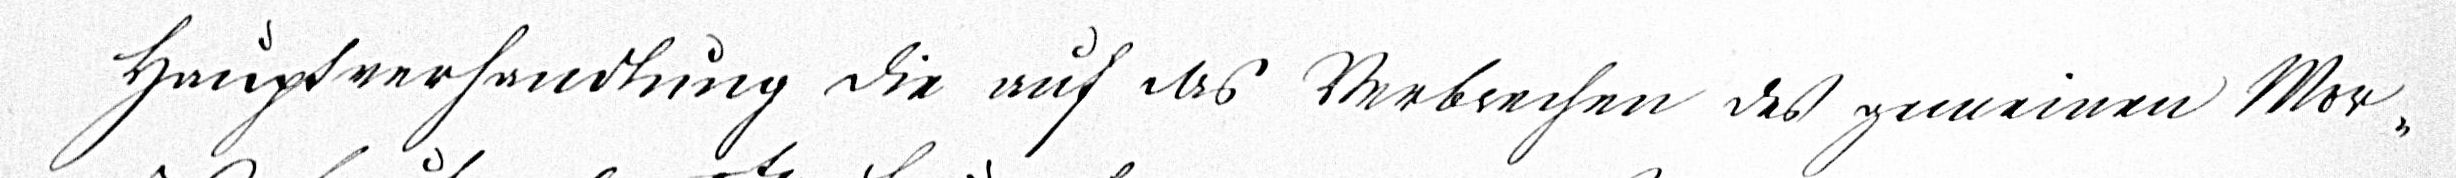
Hauptverhandlung die auf das Verbrechen des gemeinen Mor¬
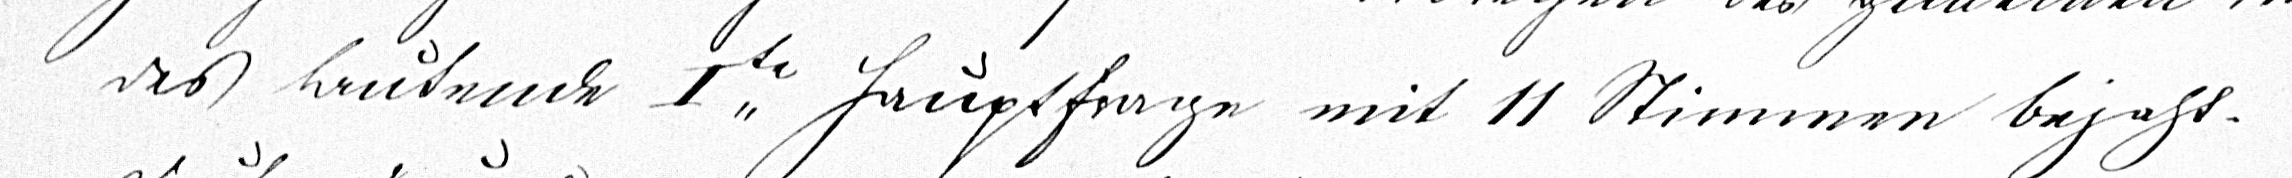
des lautende Ite Hauptfrage mit 11 Stimmen bejaht.
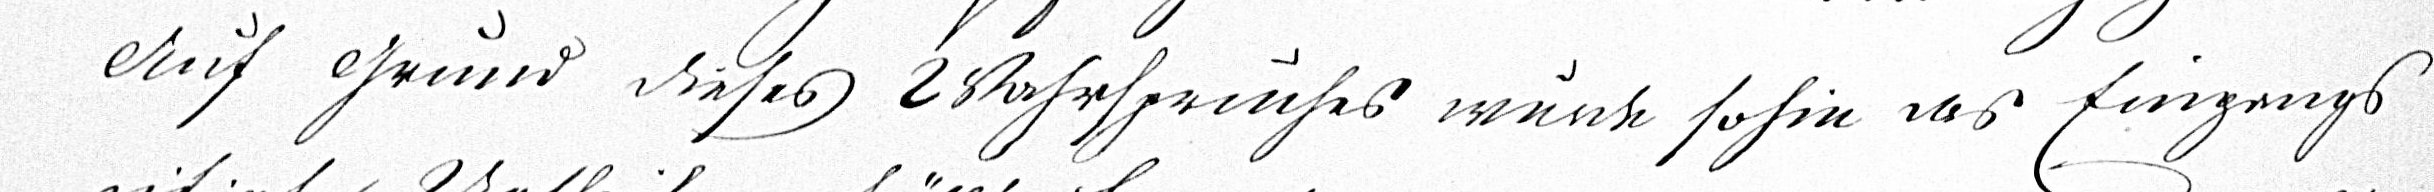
Auf Grund dieses Wahrspruches wurde sohin das Eingangs
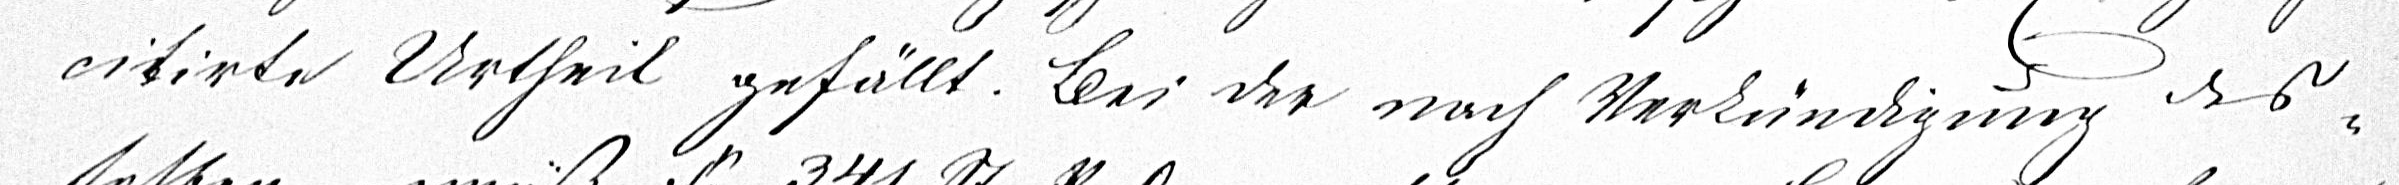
citirte Urtheil gefällt. Bei der nach Verkündigung des¬
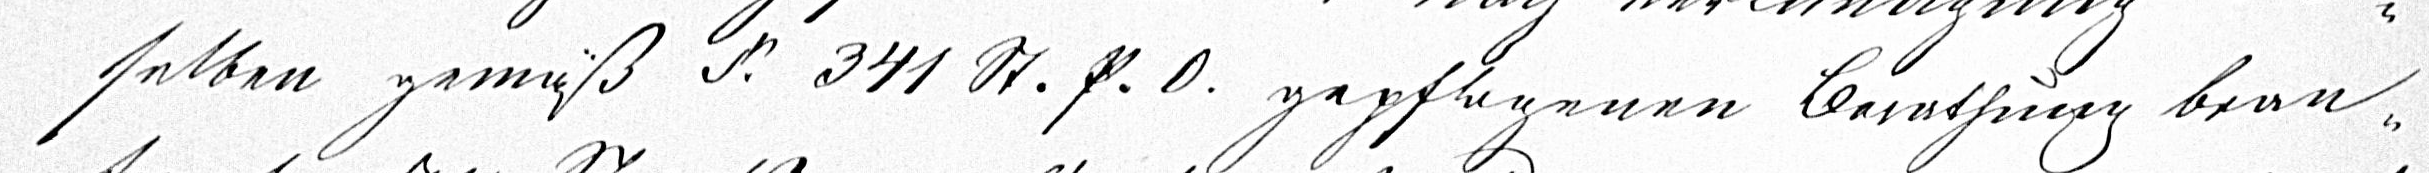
selben gemäß xx 341 St. P. O. gepflogenen Berathung bean¬
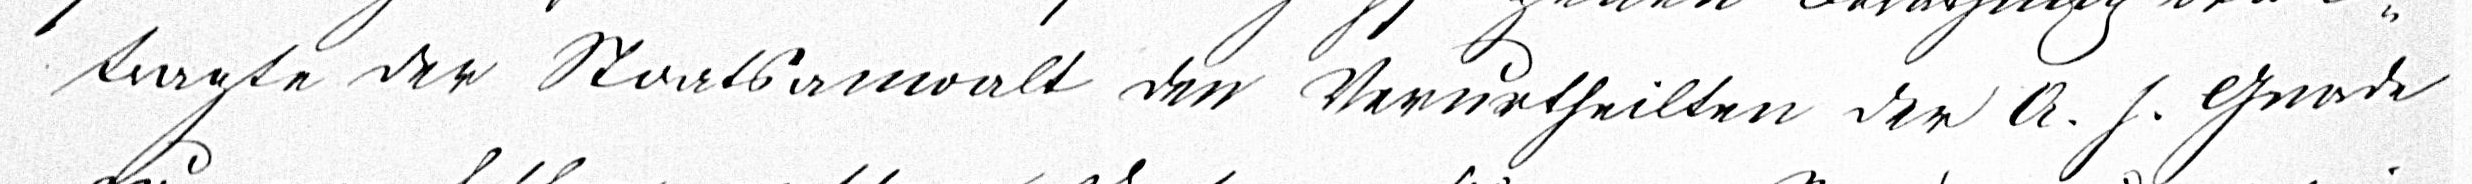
tragte der Staatsanwalt den Verurtheilten der A. h. Gnade
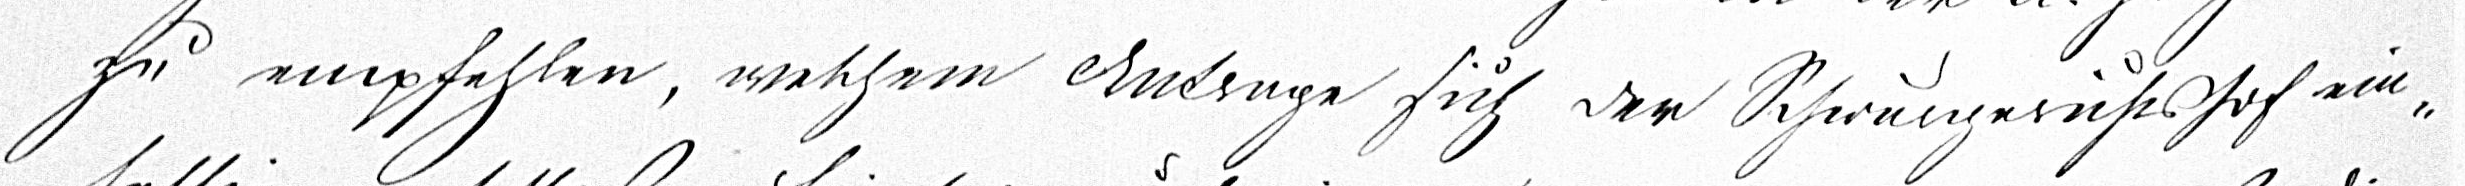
zu empfehlen, welchem Antrage sich der Schwurgerichtshof ein¬
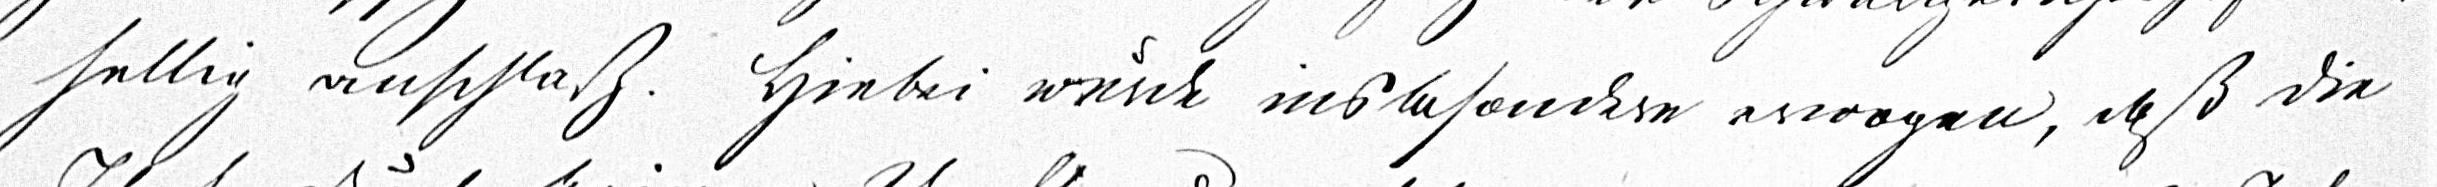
hellig anschloß. Hiebei wurde insbesondere erwogen, daß die
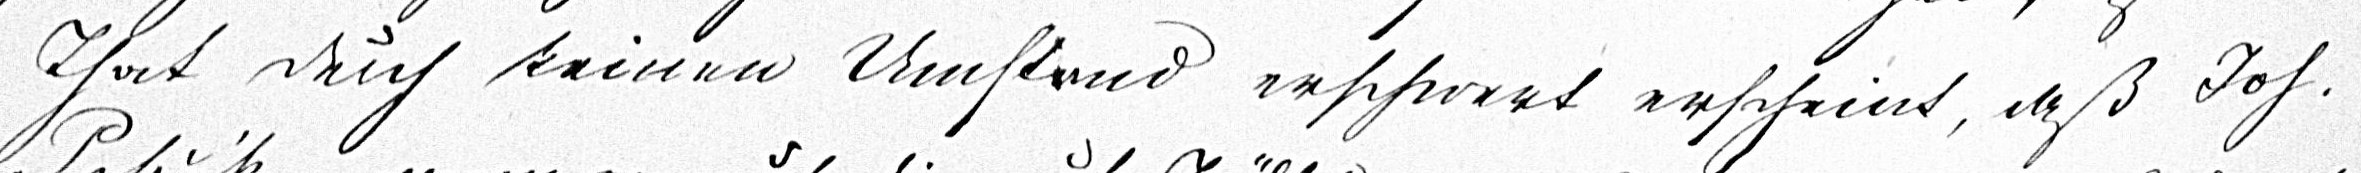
That durch keinen Umstand erschwert erscheint, daß Joh.
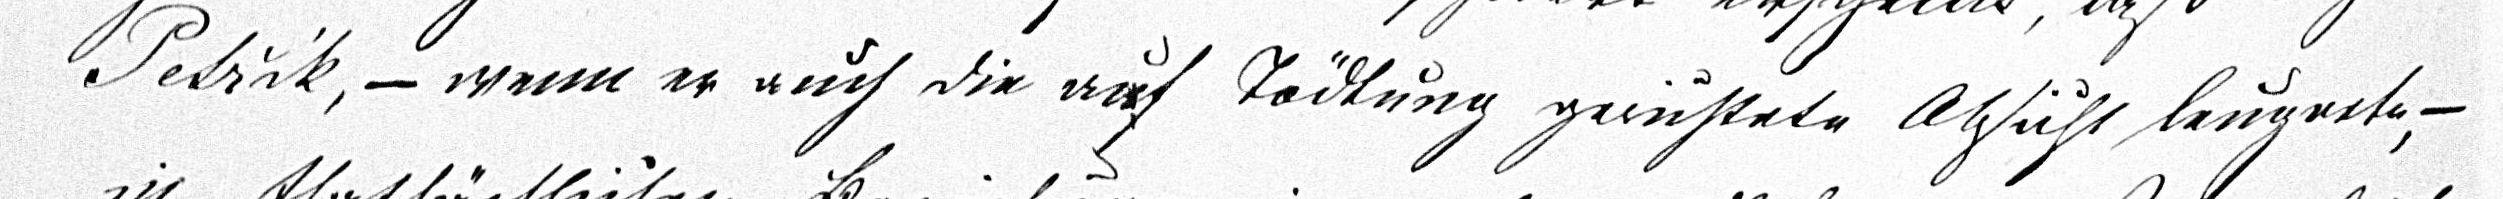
Petxxk, - wenn er auch die auf Tödtung gerichtete Absicht leugnete,-
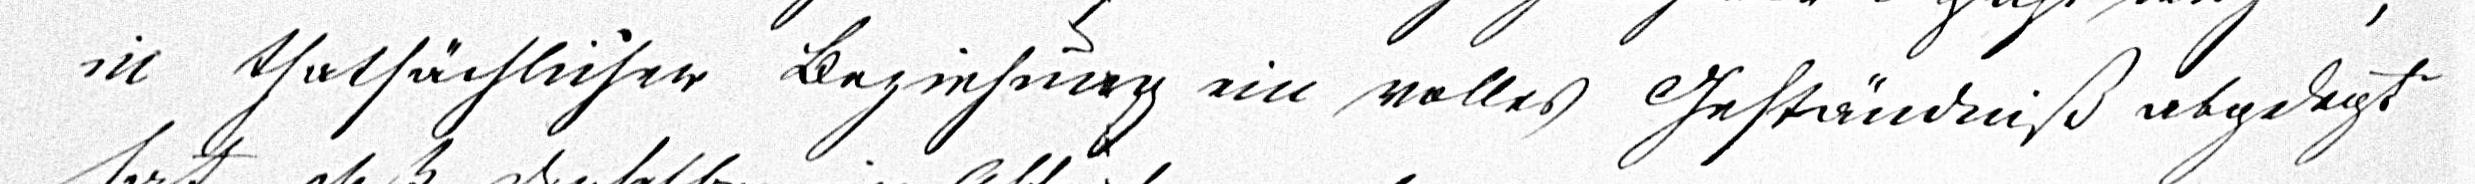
in thatsächlicher Beziehung ein volles Geständniß abgelegt
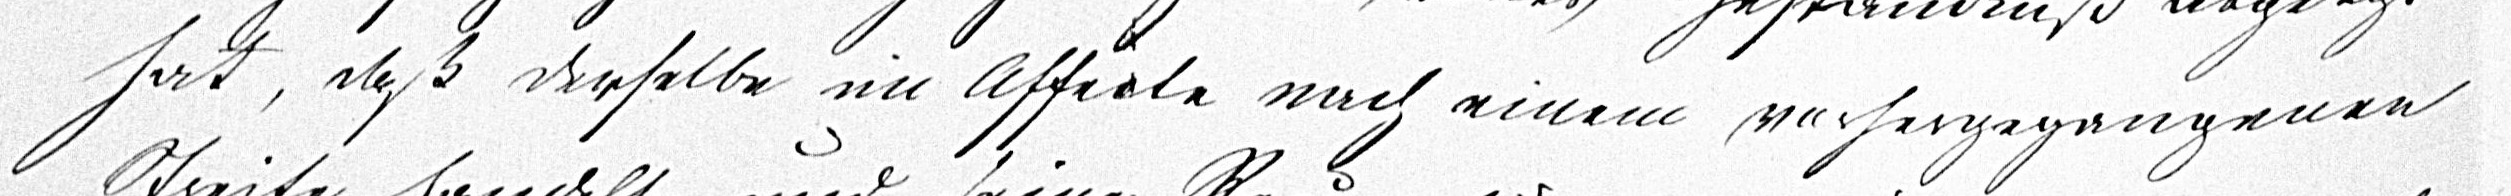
hat, daß derselbe im Affecte nach einem vorhergegangenen
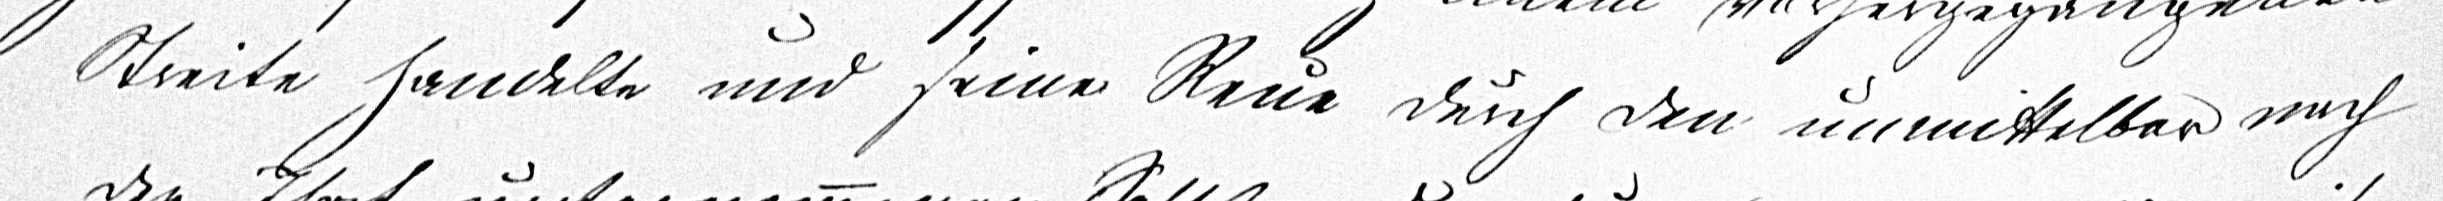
Streite handelte und seine Reue durch den unmittelbar nach
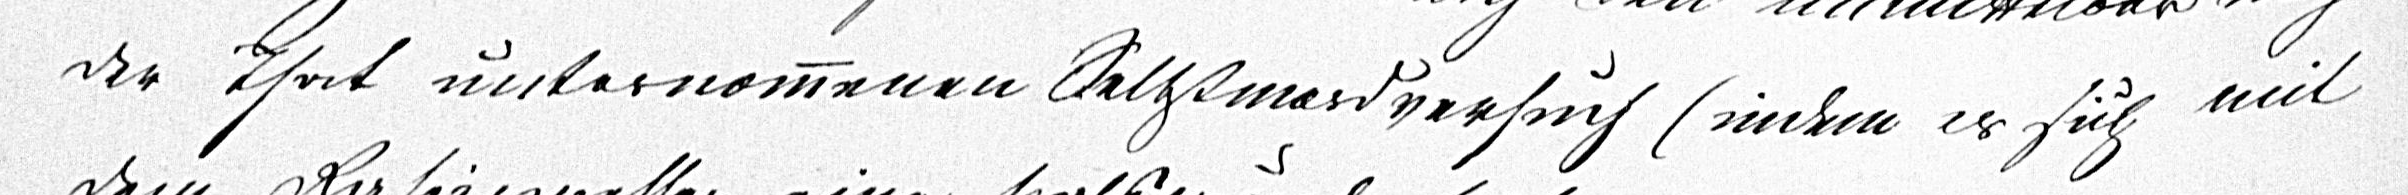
der That unternommenen Selbstmordversuch (indem er sich mit
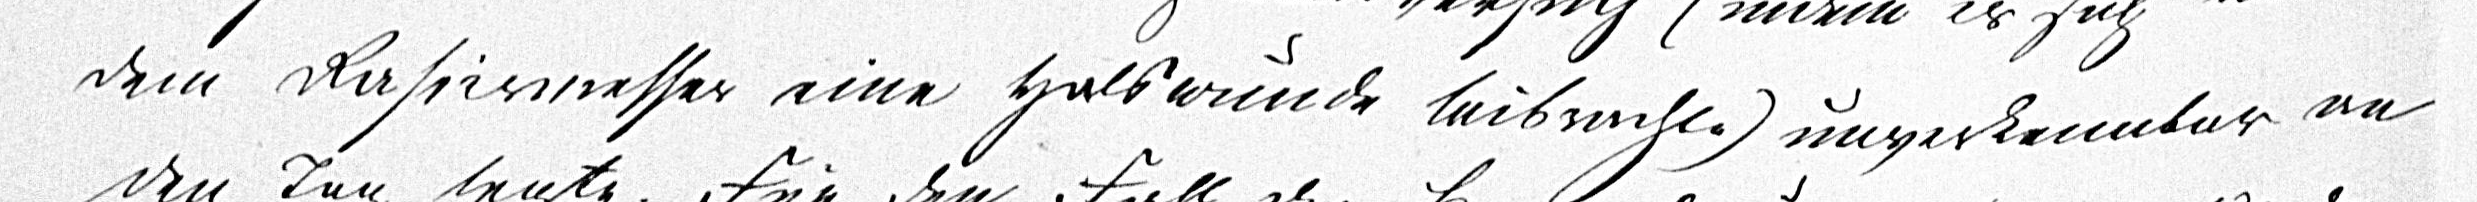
dem Rasixxmesser eine Halswunde leibrecht.) unverkennbar an
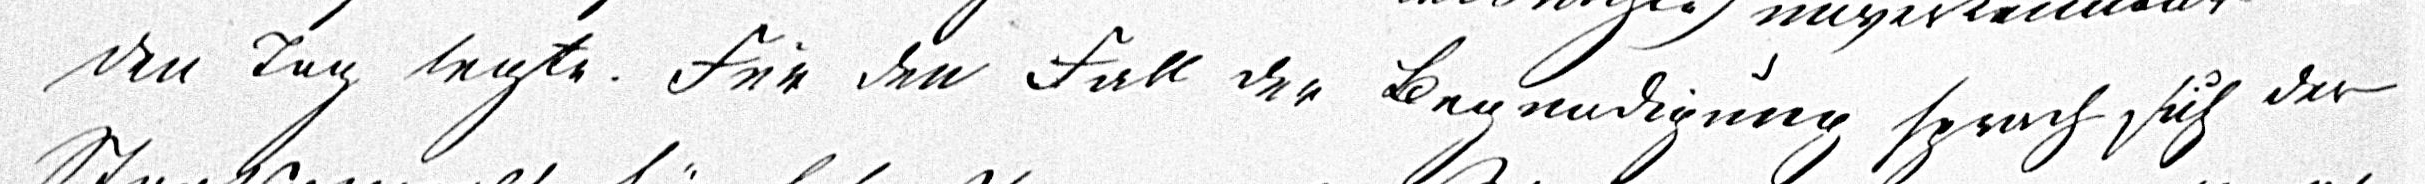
den Tag legte. Für den Fall der Benadigung sprach sich der
